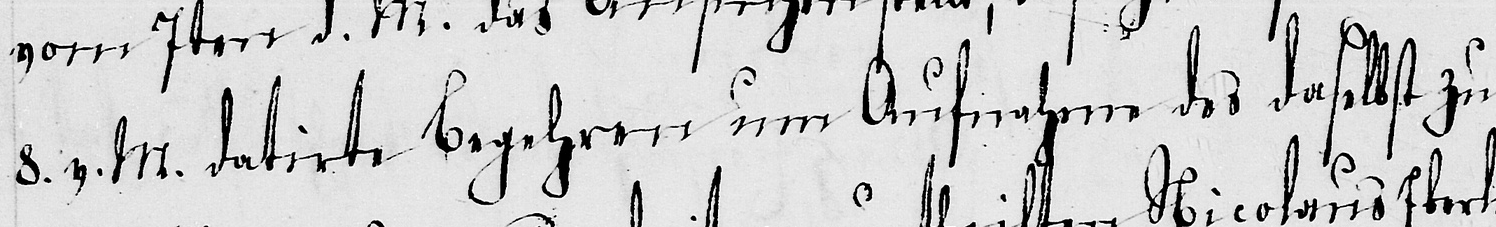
8. v. M. datirte Begehren um Aufnahme des daselbst zu
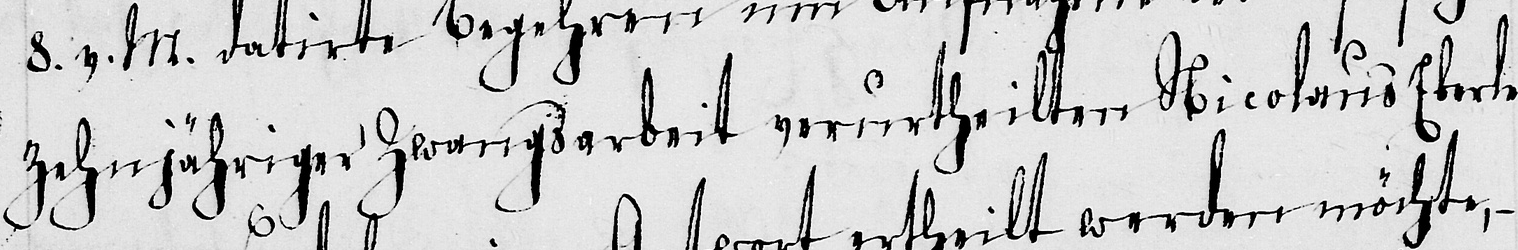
zehnjähriger Zwangsarbeit verurtheilten Nicolaus Eberle
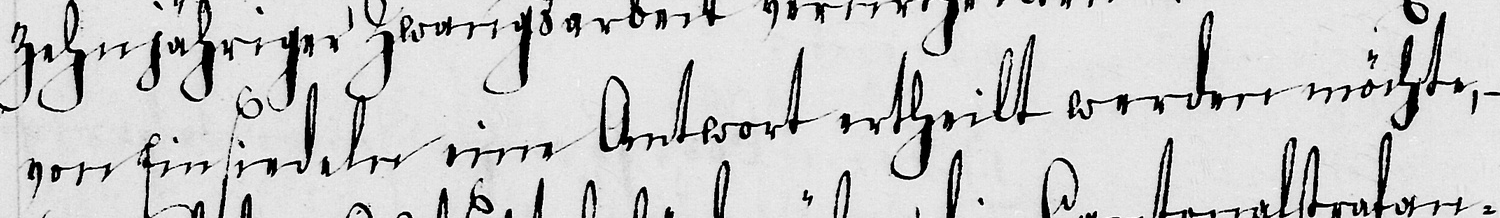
von Einsiedeln eine Antwort ertheilt werden möchte,
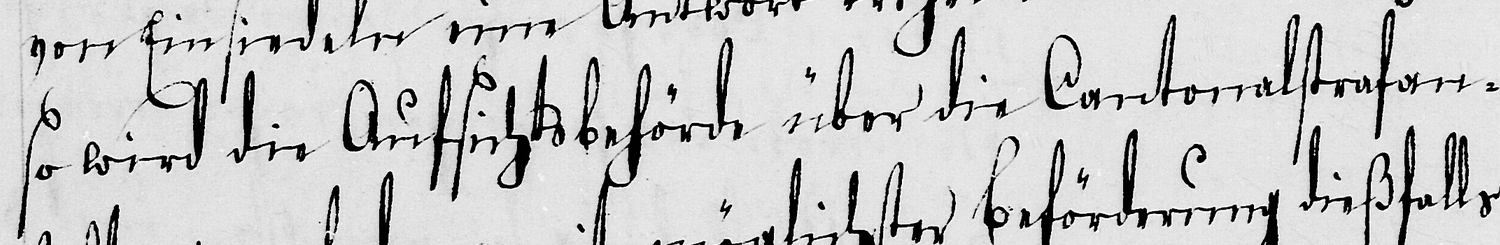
so wird die Aufsichtsbehörde über die Cantonalstrafan¬
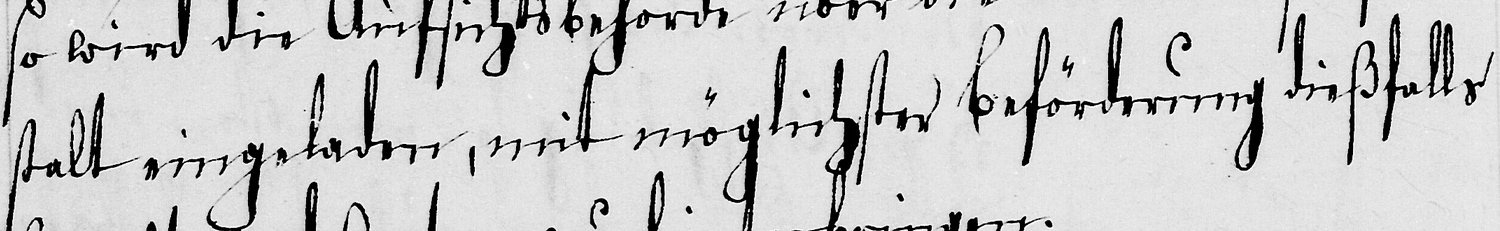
stalt eingeladen, mit möglichster Beförderung dießfal¬
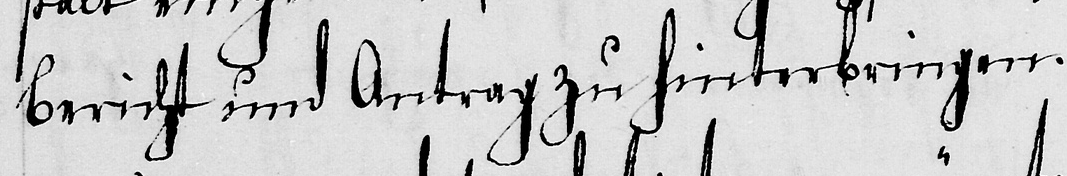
Bericht und Antrag zu hinterbringen.
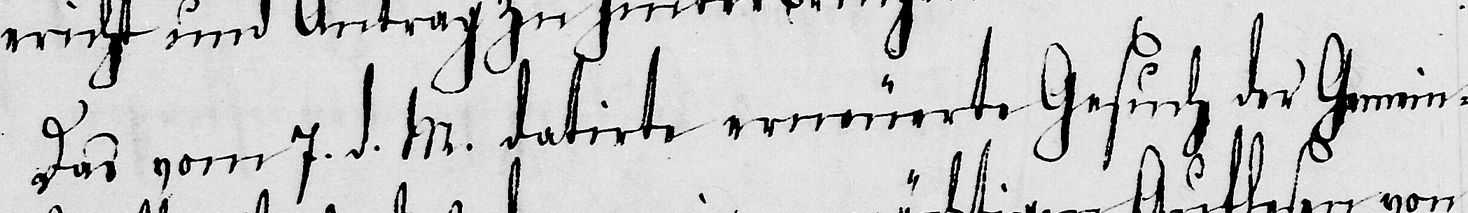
Das vom 7. d. M. datirte erneuerte Gesuch der Gemein¬
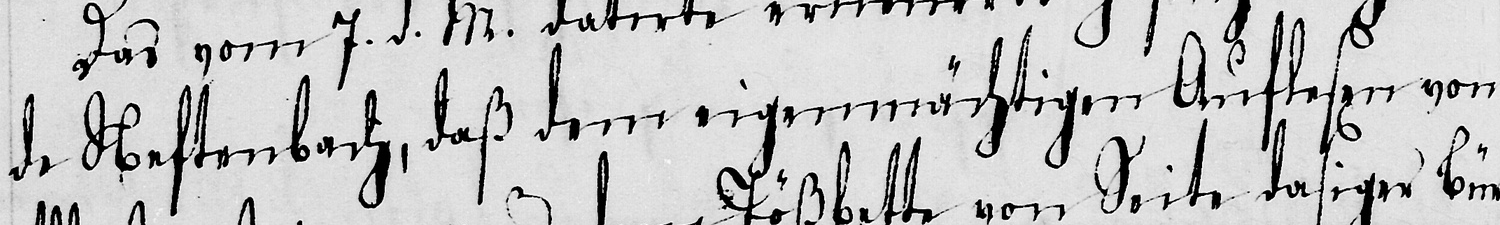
de Neftenbach, daß dem eigenmächtigen Auflesen von
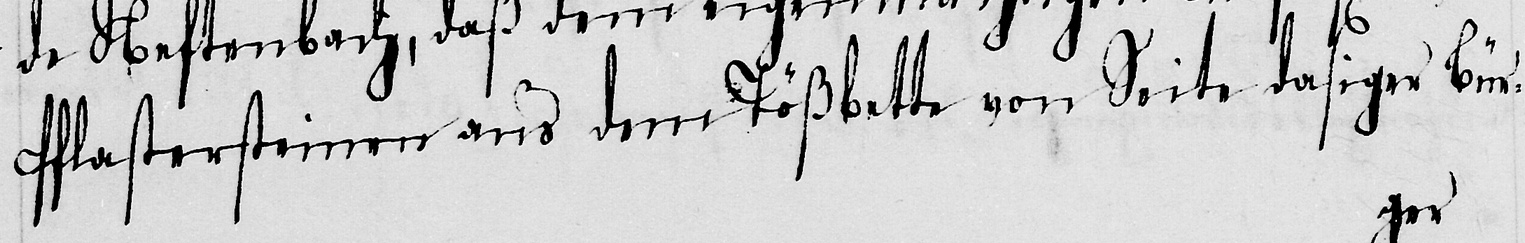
Pflastersteinen aus dem Tößbette von Seite der dasi¬
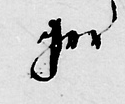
gen
